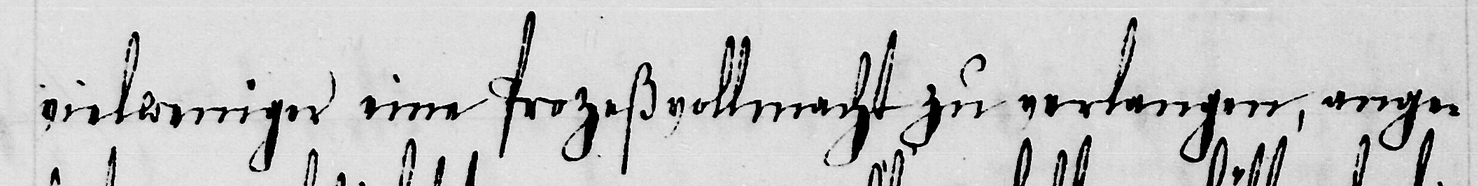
vielweniger eine Prozeßvollmacht zu verlangen, ange¬
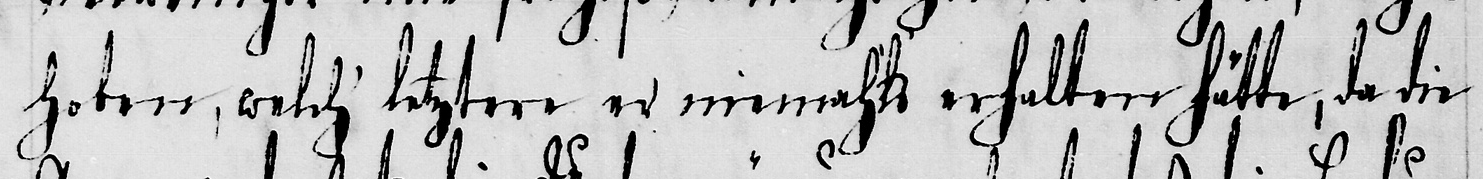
hoben, welch’ letztere er niemahls erhalten hätte, da die
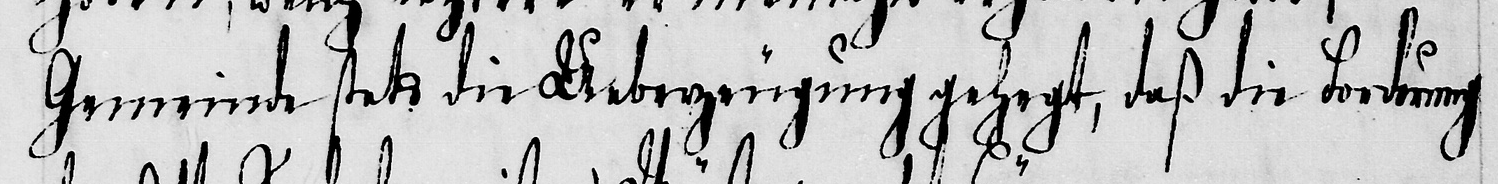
Gemeinde stets die Ueberzeugung gehegt, daß die Forderung
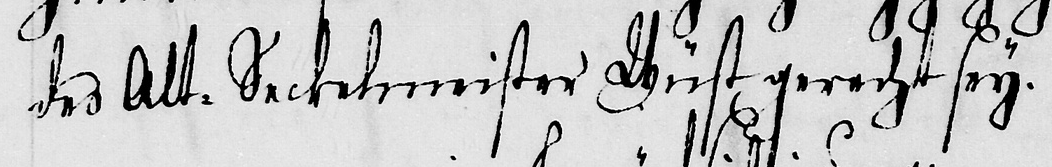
des Alt-Seckelmeister Wüst gerecht sey.
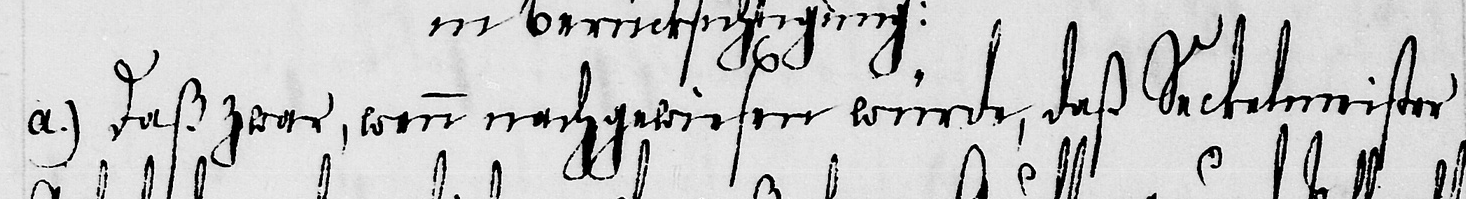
a.) Daß zwar, wenn nachgewiesen würde, daß Seckelmeister
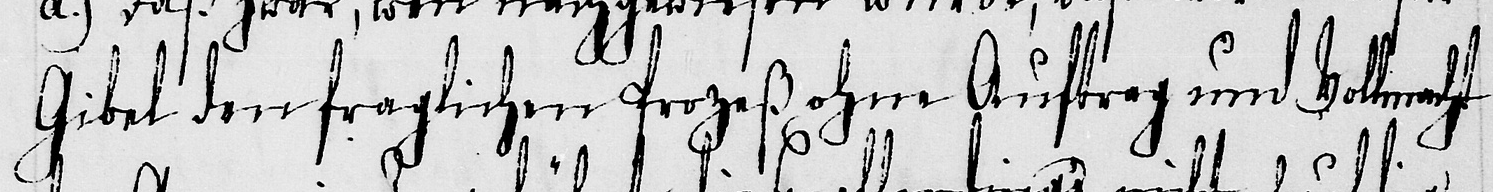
Gibel den fraglichen Prozeß ohne Auftrag und Vollma¬
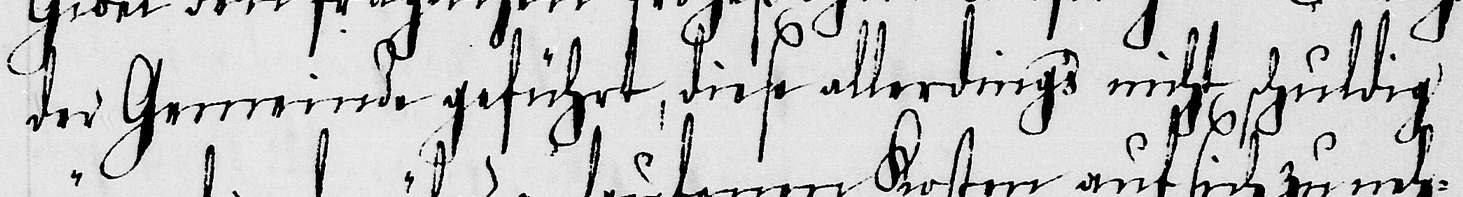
der Gemeinde geführt, diese allerdings nicht schuldig
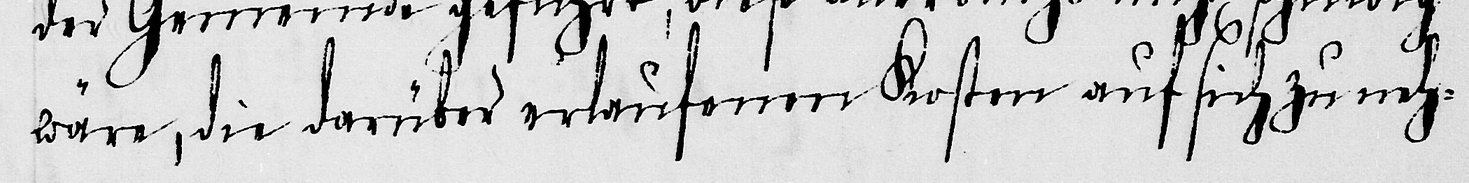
wäre, die darüber erlaufenen Kosten auf sich zu neh¬
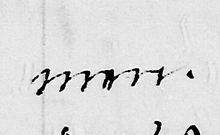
men.
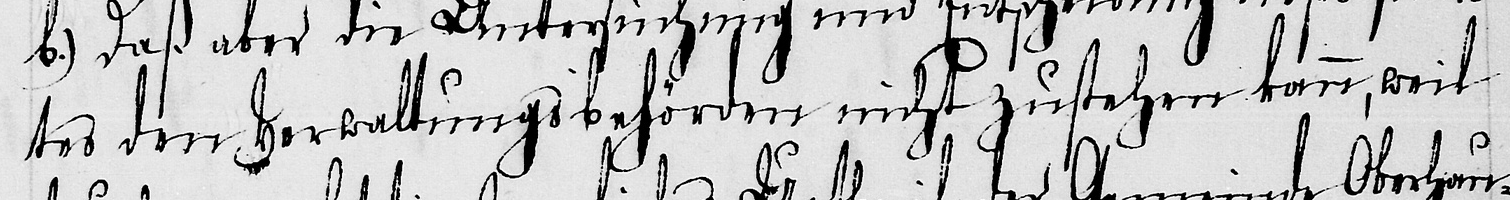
tes den Verwaltungsbehörden nicht zustehen kann, weil
